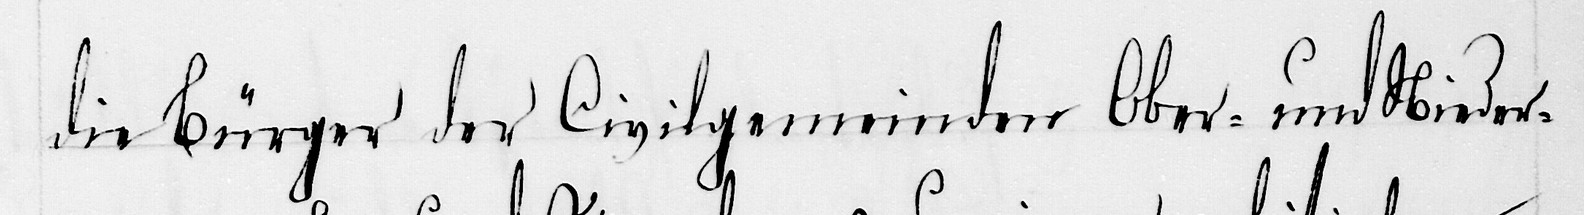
die Bürger der Civilgemeinden Ober- und Nieder¬
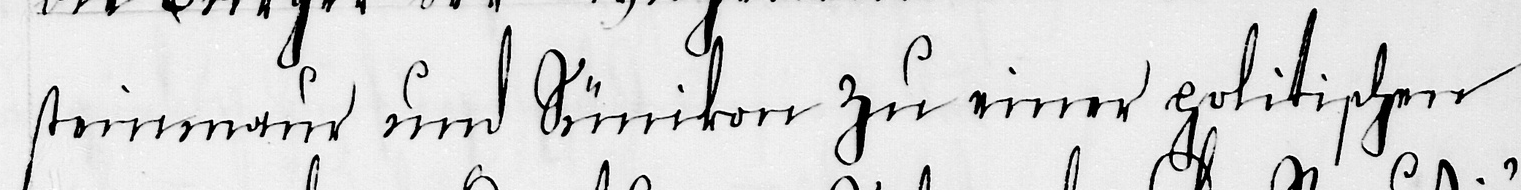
steinmaur und Sünikon zu einer politischen
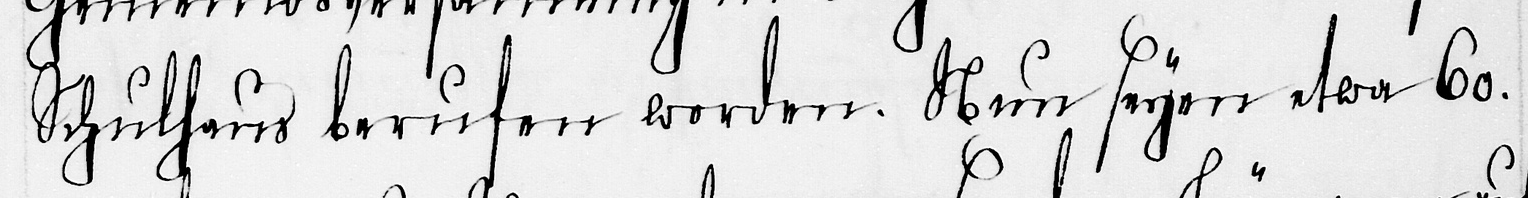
Schulhaus berufen worden. Nun seyen etwa 60.
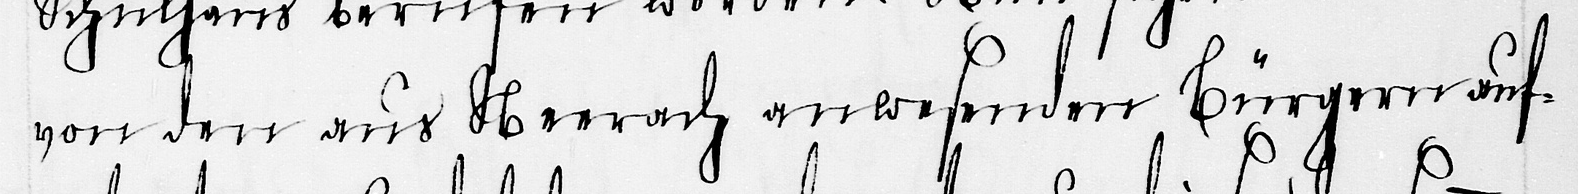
von den aus Neerach anwesenden Bürgern auf¬
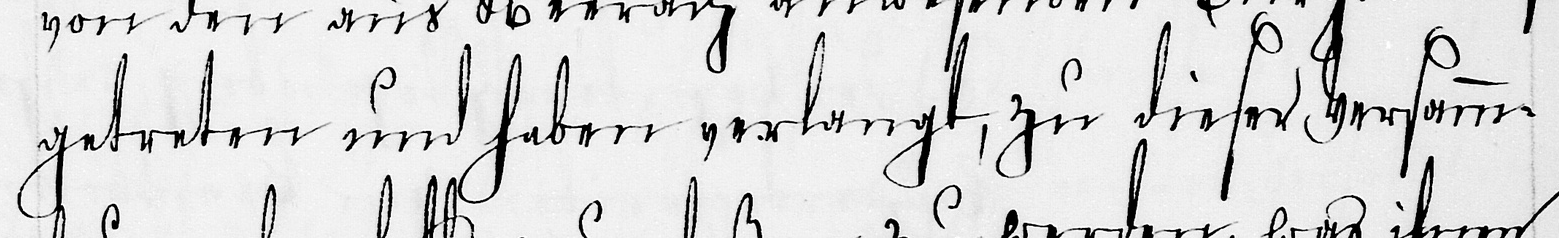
getreten und haben verlangt, zu dieser Versam¬
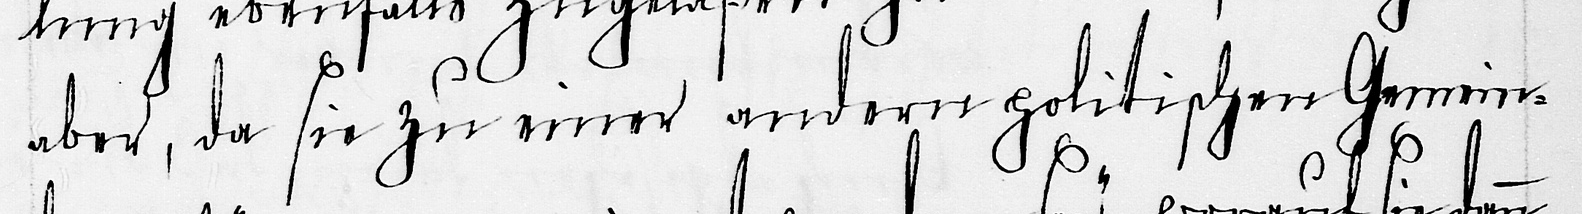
aber, da sie zu einer andern politischen Gemein¬
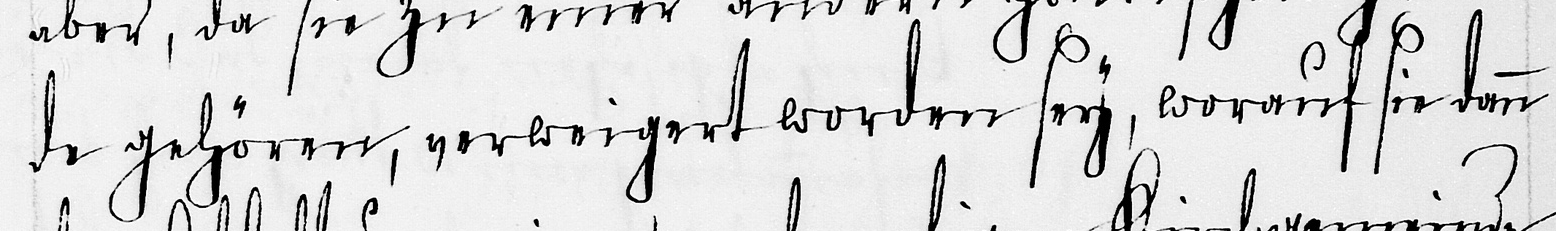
de gehören, verweigert worden sey, worauf sie dann
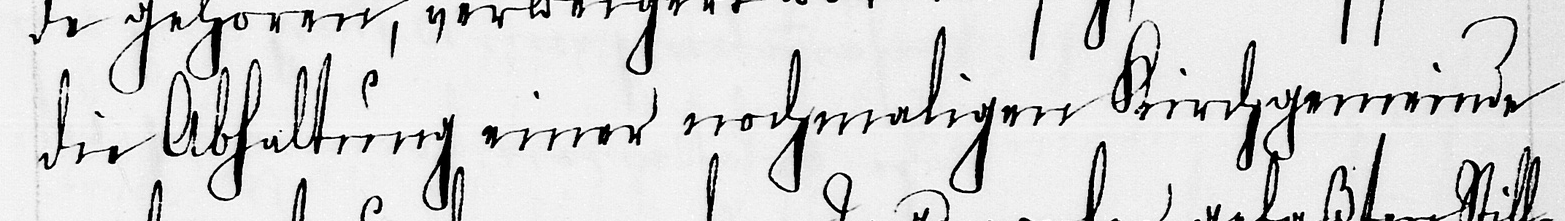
die Abhaltung einer nochmaligen Kirchgemeinde
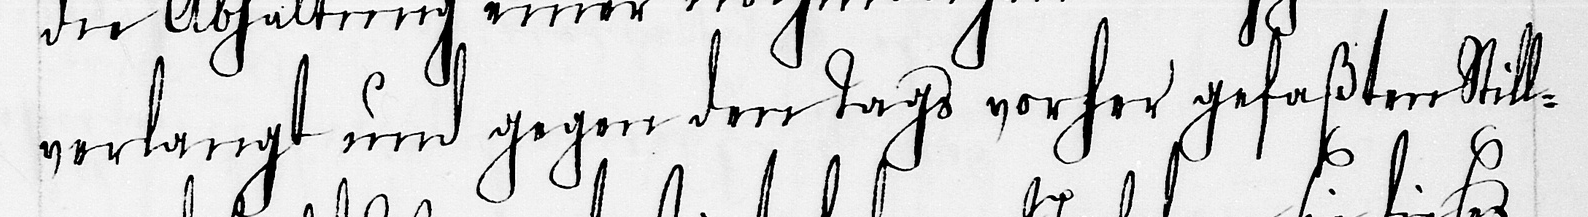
verlangt und gegen den Tags vorher gefaßten Stil¬
